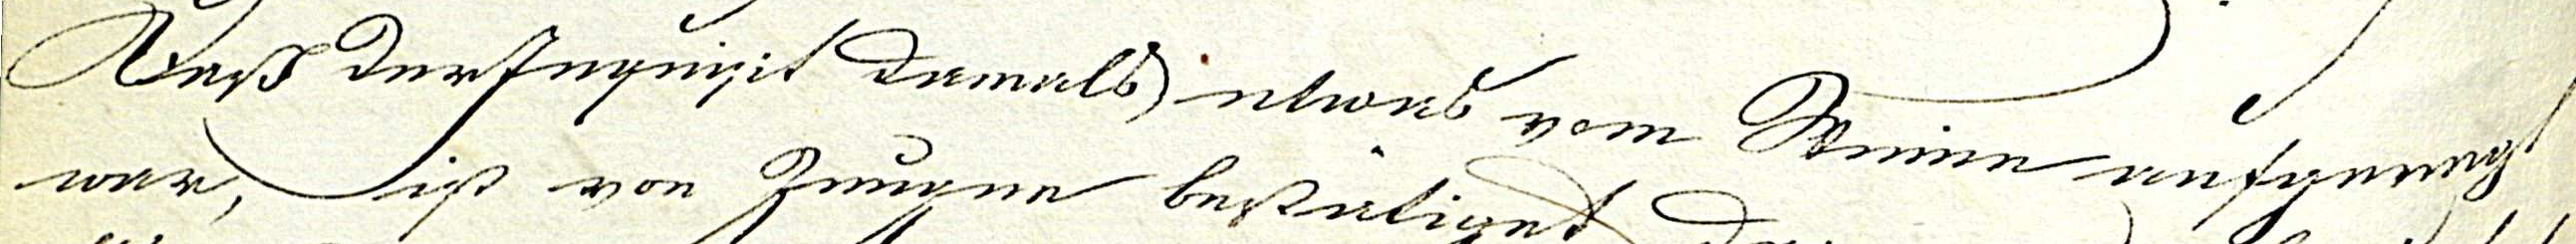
Daß der Inquisit damals etwas vom Weine aufgeregt
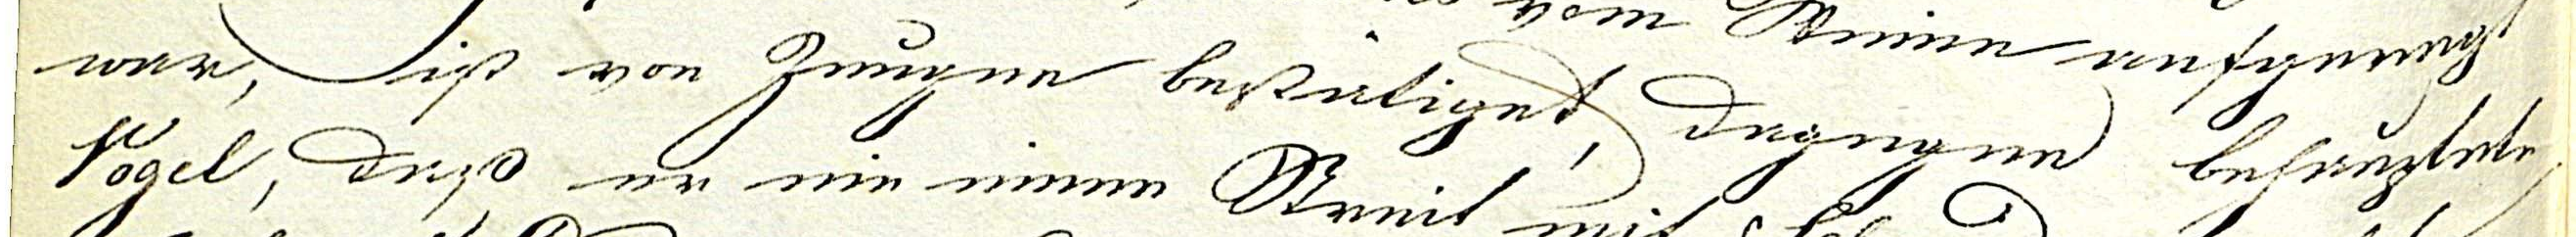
war, ist von Zeugen bestätigt, dagegen behauptete
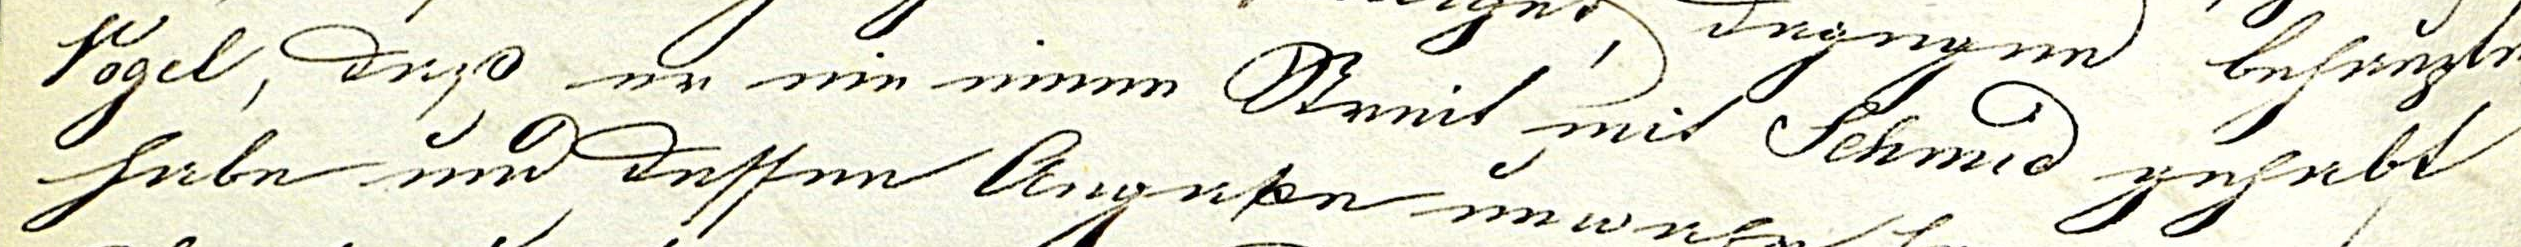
Vogel, daß er nie einen Streit mit Schmid gehabt
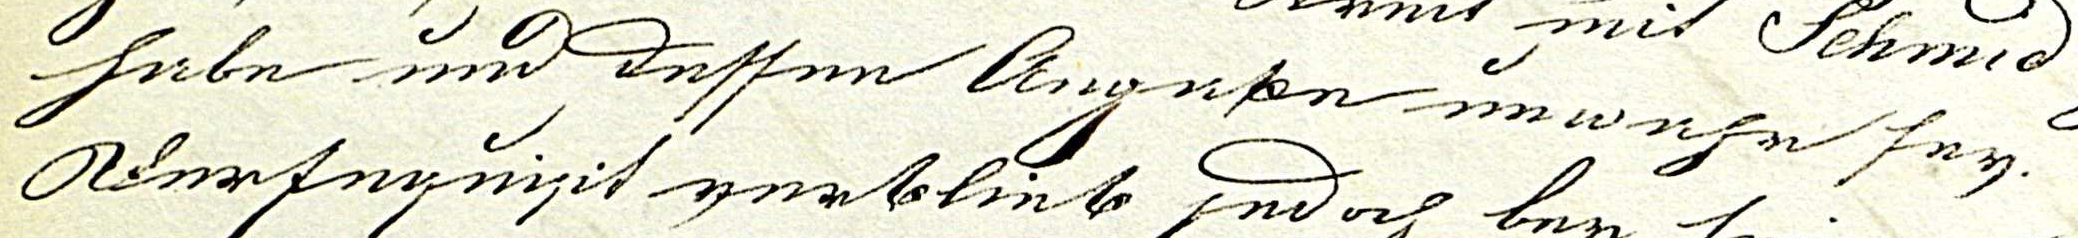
habe und dessen Angabe unwahr sey.
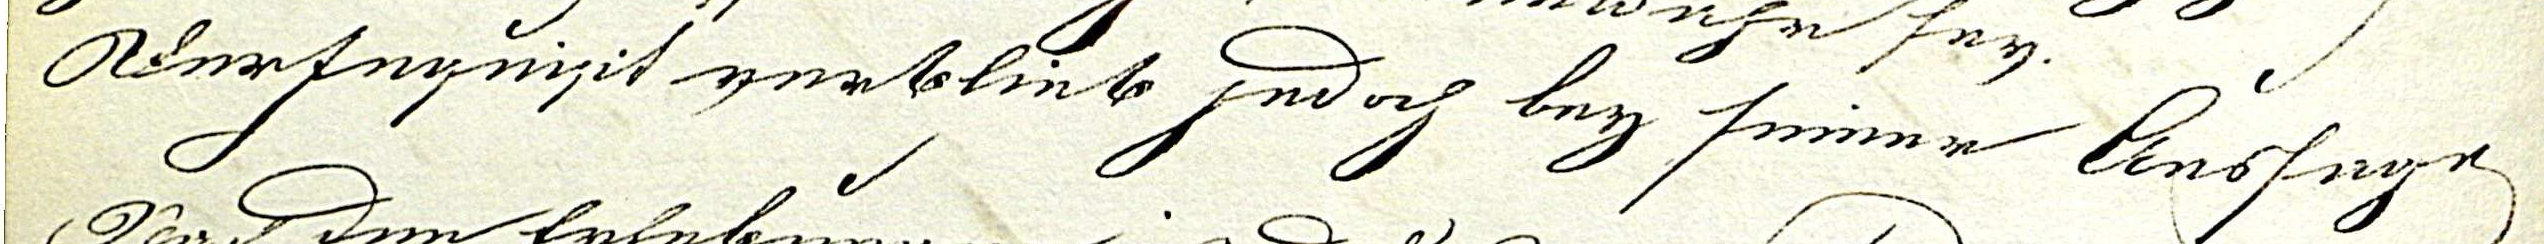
Der Inquisit verblieb jedoch bey seiner Aussage.
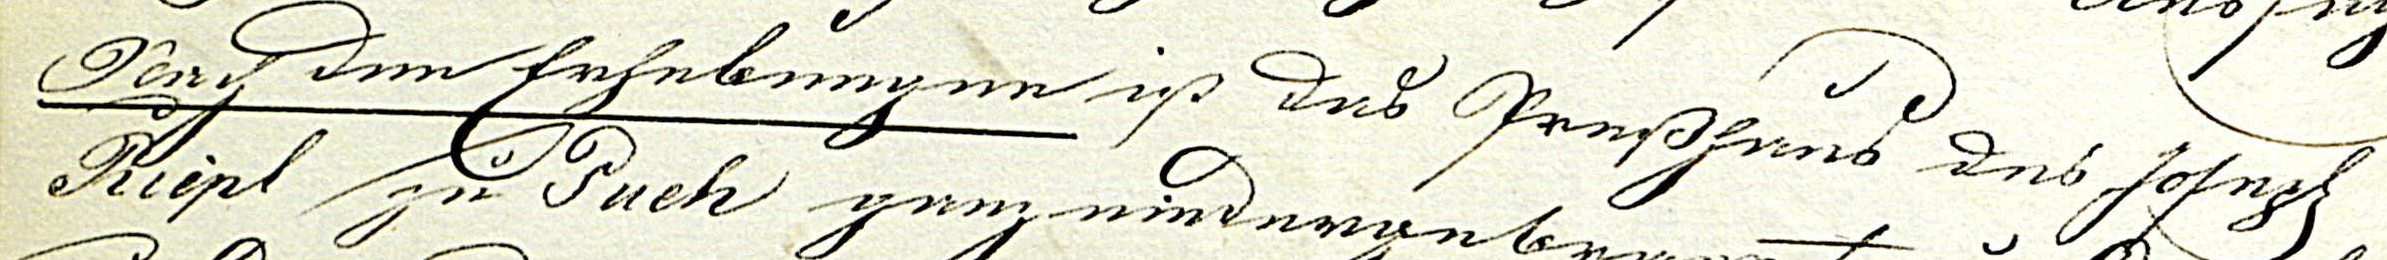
Nach dem Erhebungen ist das Preßhaus des Joseph
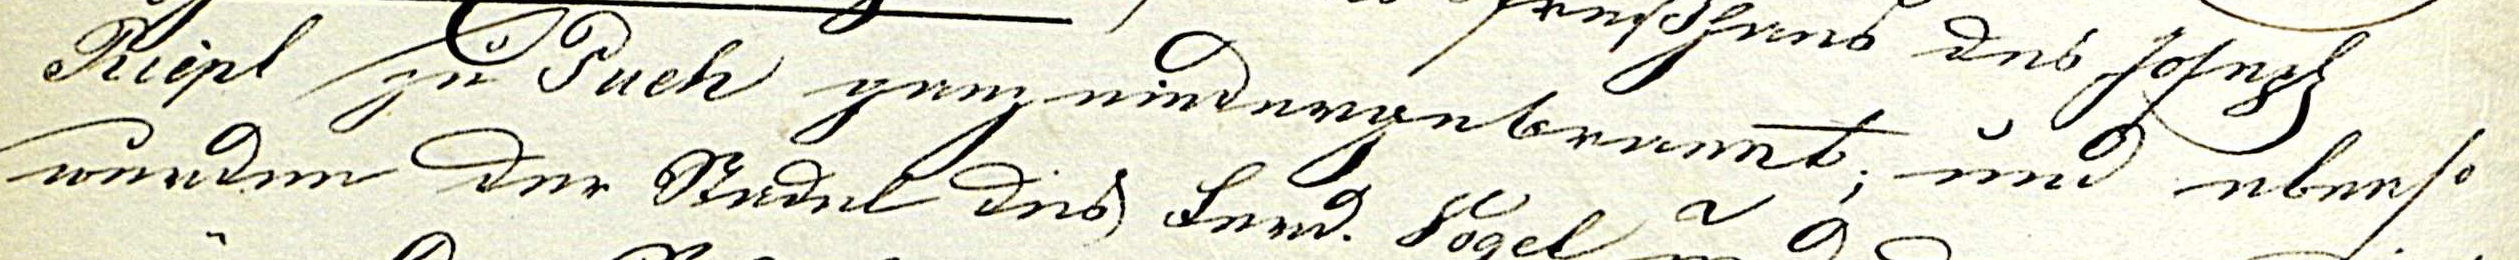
Riepl zu Puch ganz niedergebrannt; und ebenso
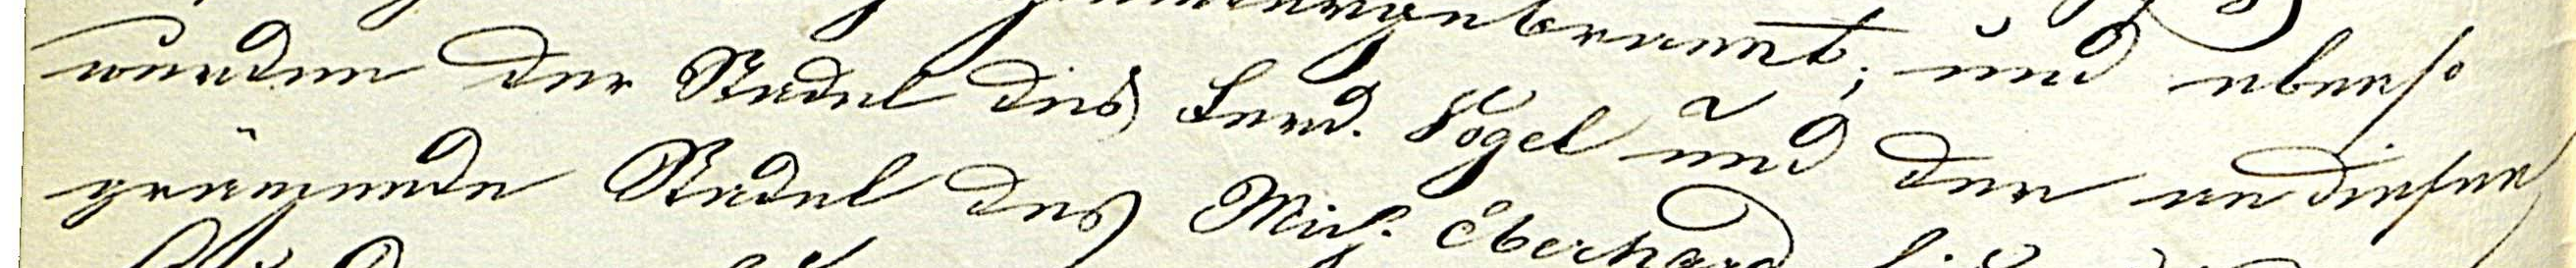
wurden der Stadel des Ferd. Vogel und der an diesen
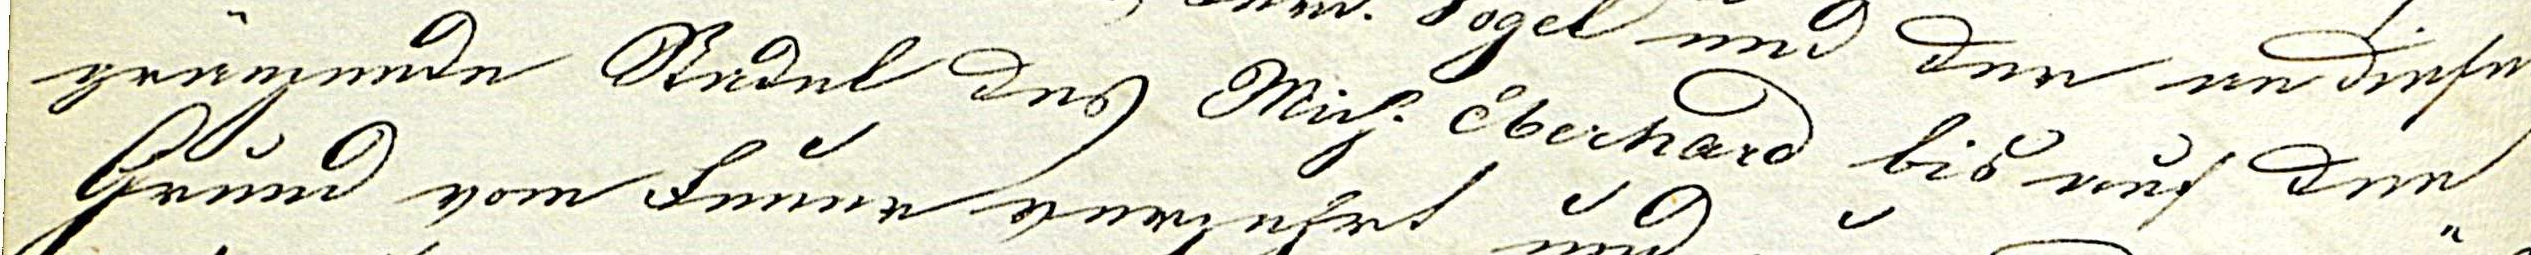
gränzende Stadel des Mich. Eberhard bis auf den
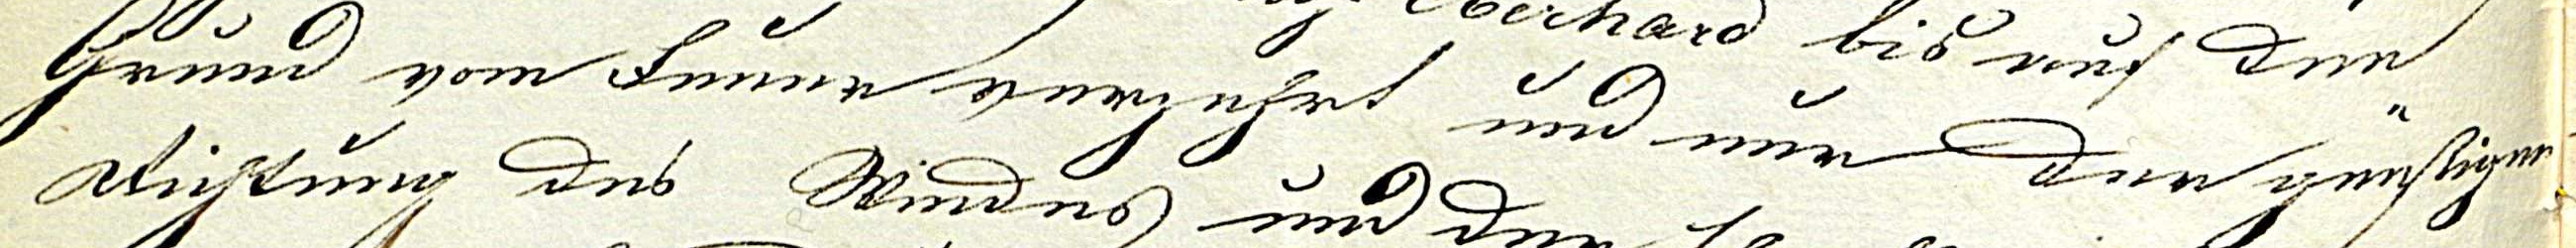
Grund vom Feuer verzehrt und nur der günstigen
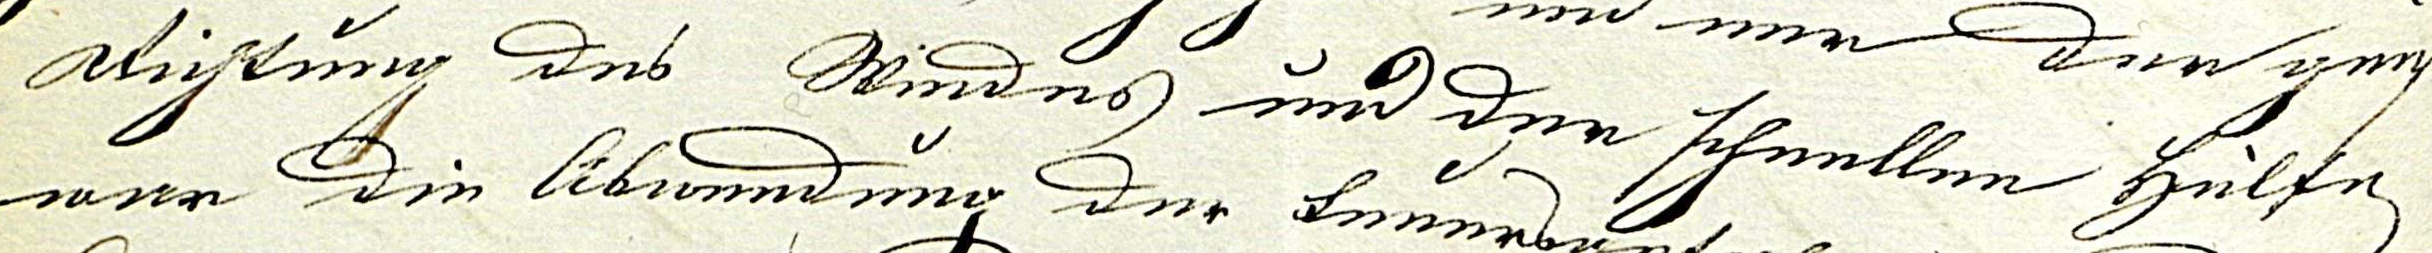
Richtung des Windes und der schnellen Hülfe
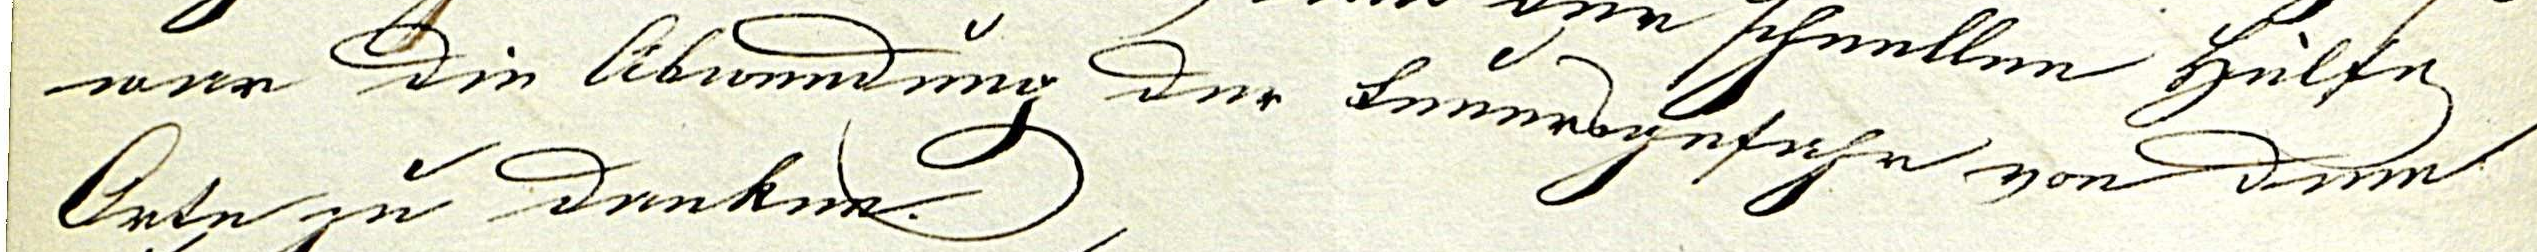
war die Abwendung der Feuergefahr von dem
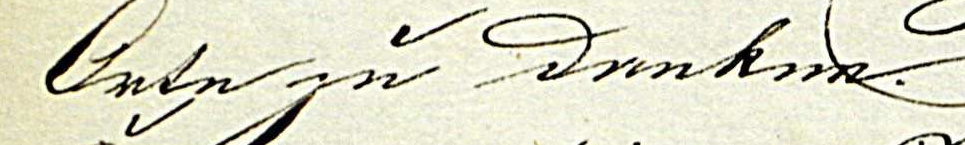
Orte zu danken.
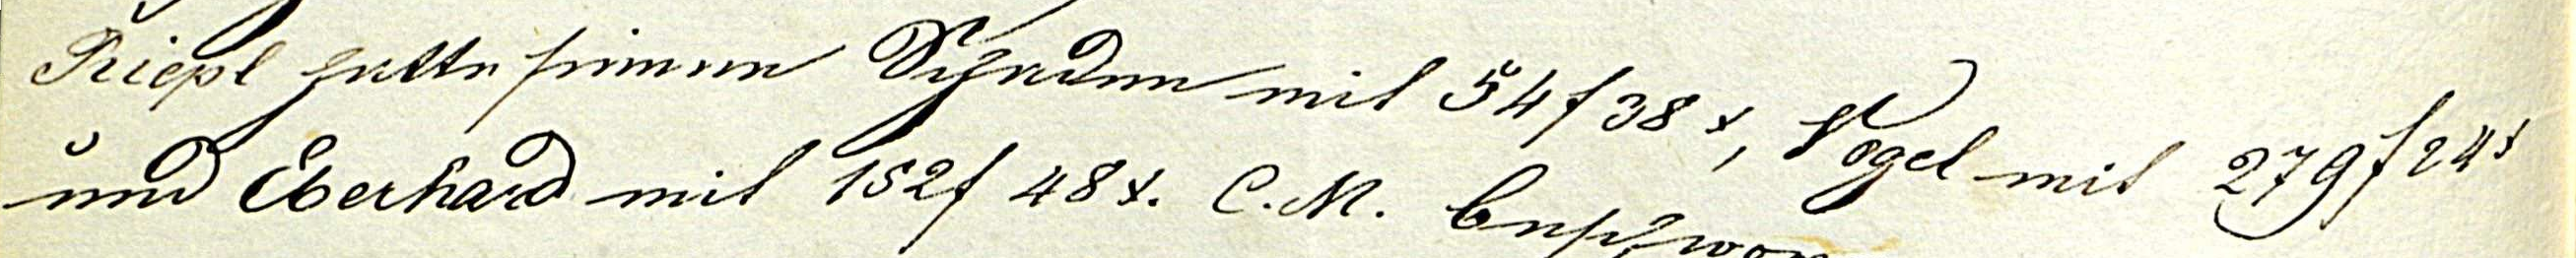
Riepl hatte seinen Schaden mit 54f 38x, Vogel mit 279f 24x
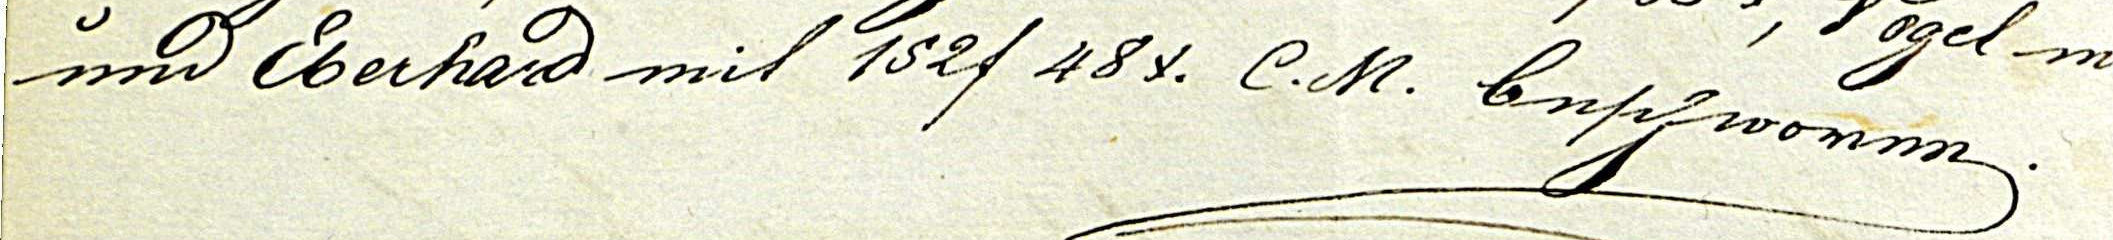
und Eberhard mit 152f 48x C.M. beschworen.
